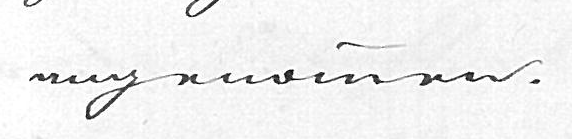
angenommen.
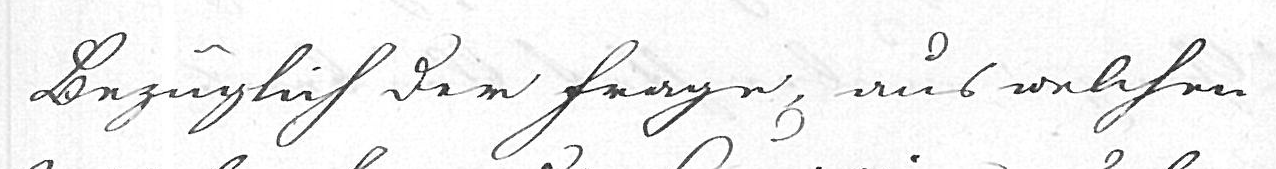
Bezüglich der Frage, aus welchen
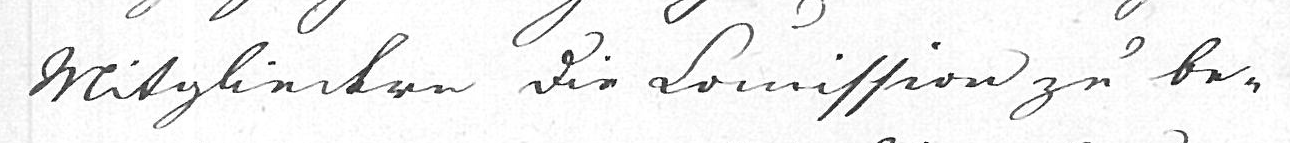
Mitgliedern die Commission zu be-
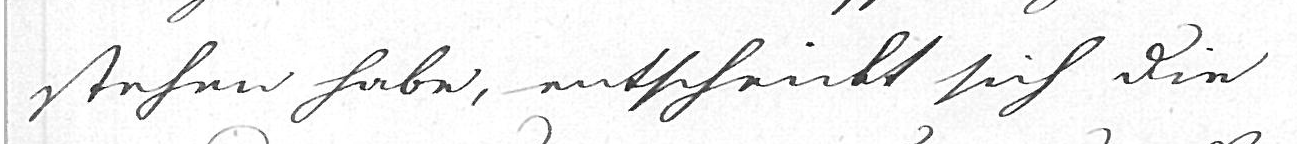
stehen habe, entscheidet sich die
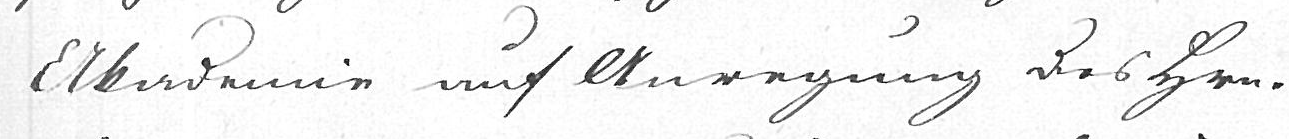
Akademie auf Anregung des Hrn.
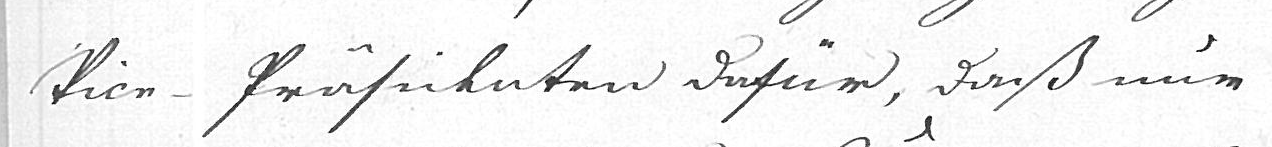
Vice-Präsidenten dafür, daß nur
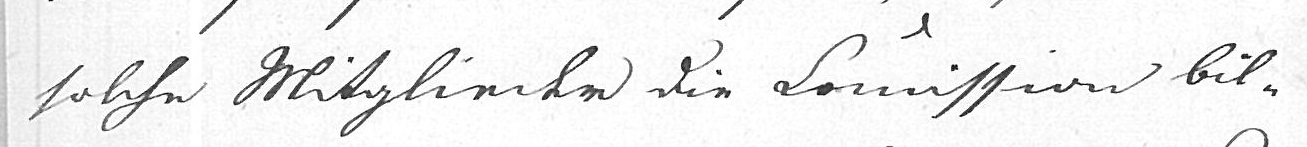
solche Mitglieder die Commission bil-
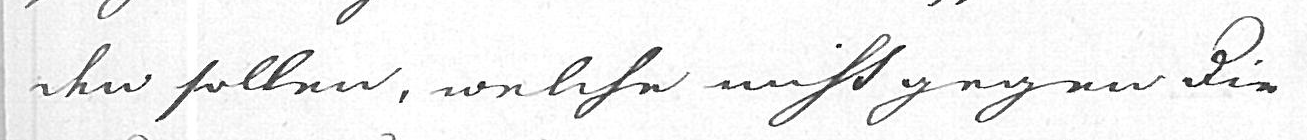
den sollen, welche nicht gegen die
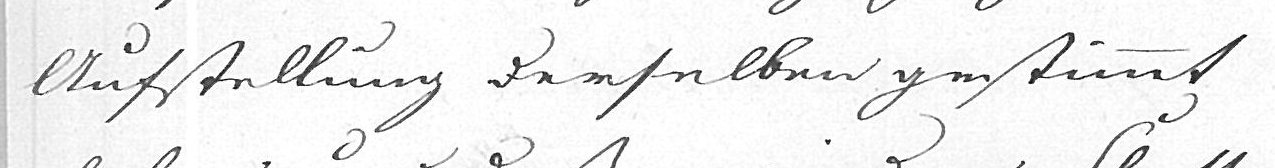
Aufstellung derselben gestimmt
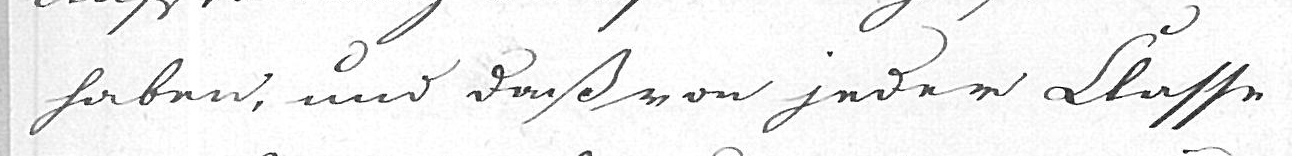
haben, und daß von jeder Classe
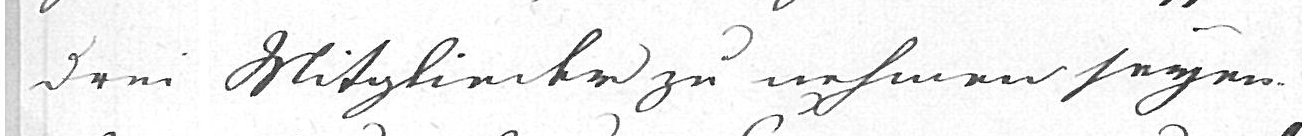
drei Mitglieder zu nehmen seyen.
